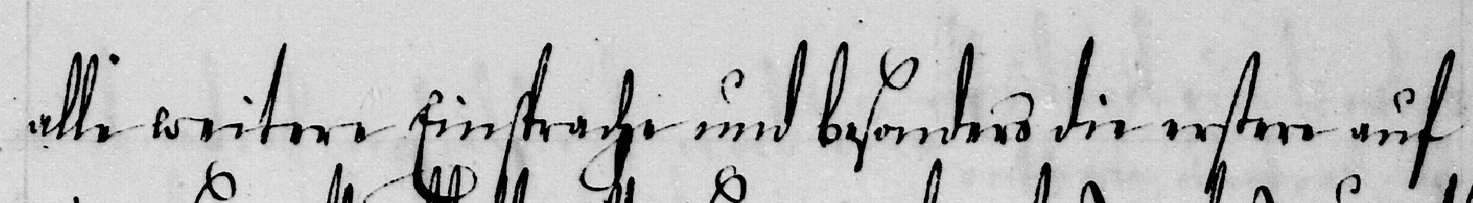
alle weitere Einsprache und besonders die ersten auf
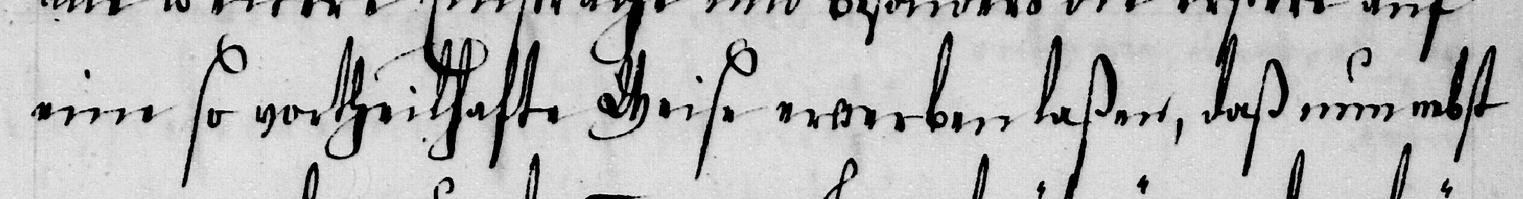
eine so vortheilhafte Weise erwerben laßen, daß nun nebst
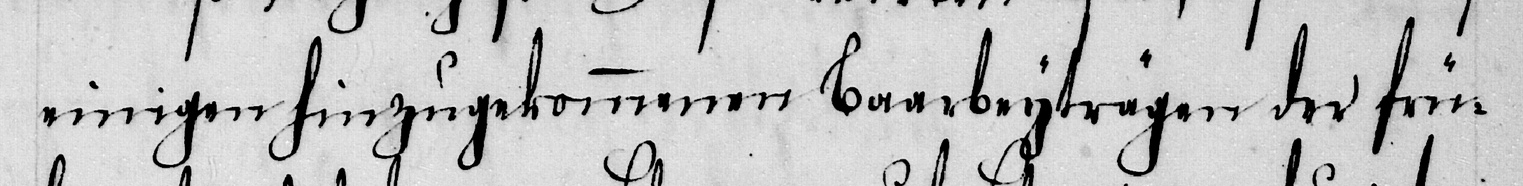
einigen hinzugekommenen Baarbeyträgen der frü¬
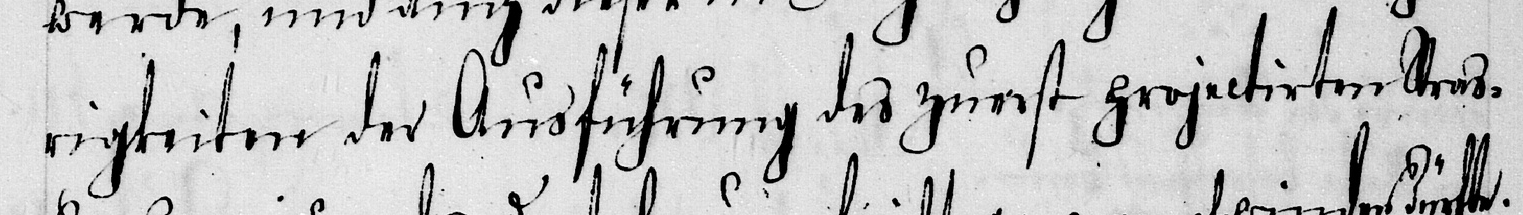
rigkeiten der Ausführung des zuerst projectirten Straß¬
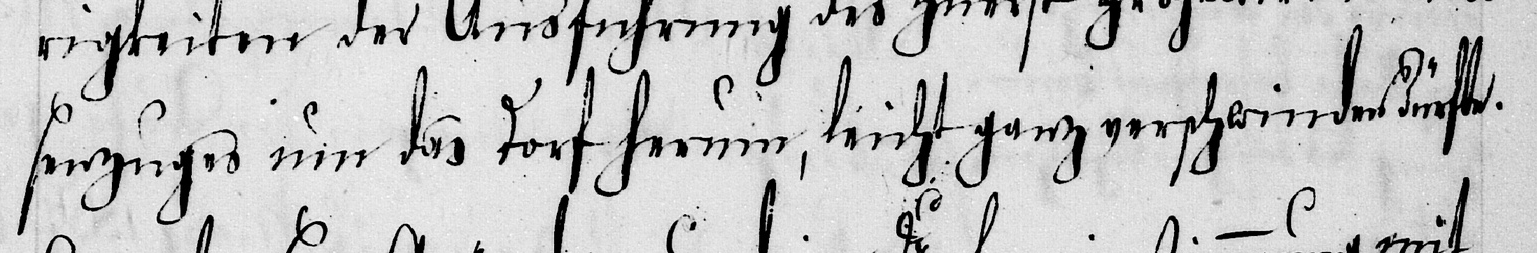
enzuges um das Dorf herum, leicht ganz verschwinden dürfte.
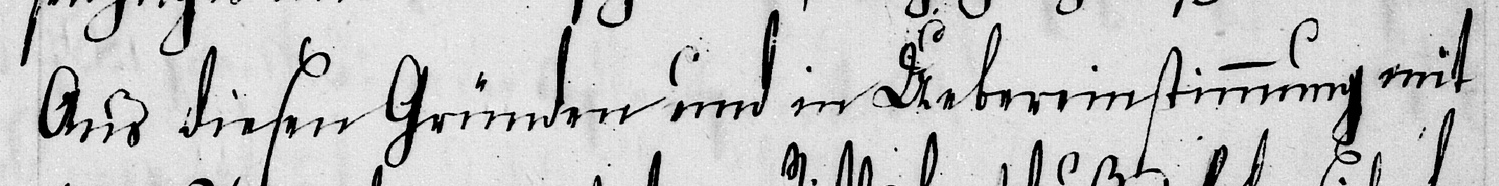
Aus diesen Gründen und in Uebereinstimmung mit
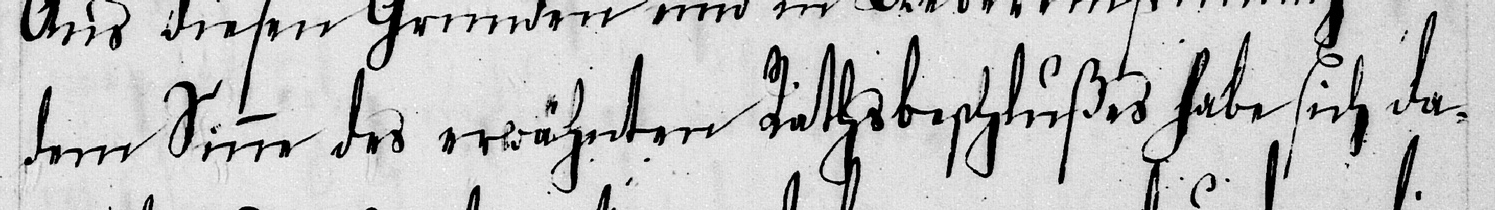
dem Sinn des erwähnten Rathsbeschlußes habe sich da¬
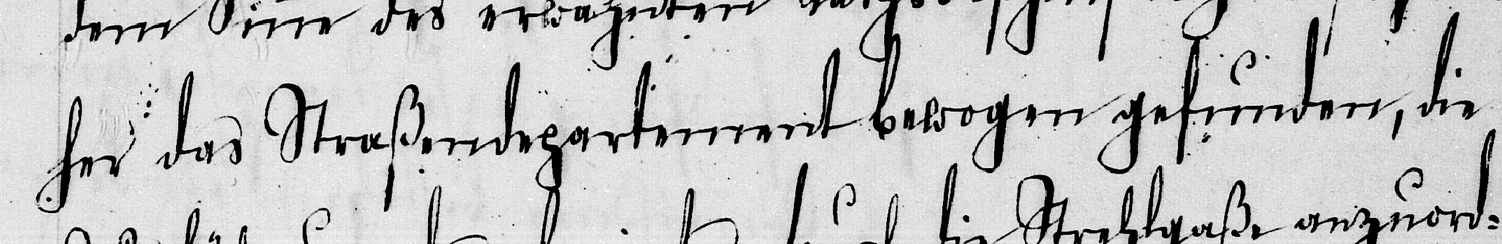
her das Straßendepartement bewogen gefunden, die
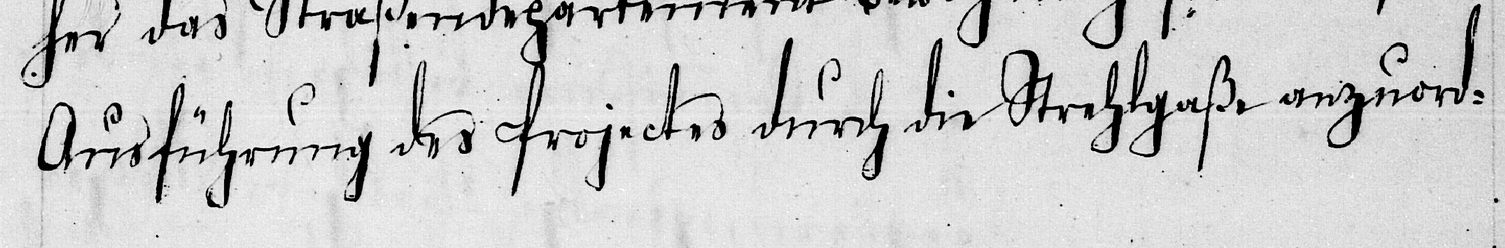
Ausführung des Projectes durch die Strehlgaße anzuord¬
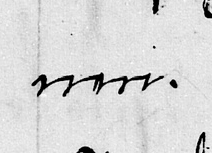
nen.
